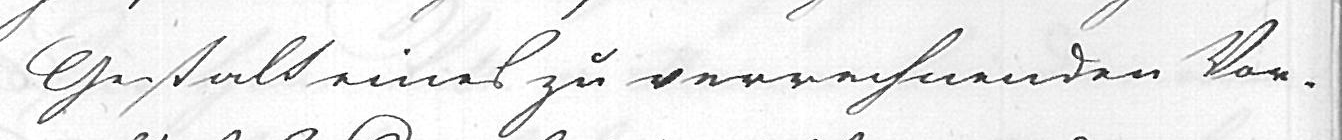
Gestalt eines zu verrechnenden Vor-
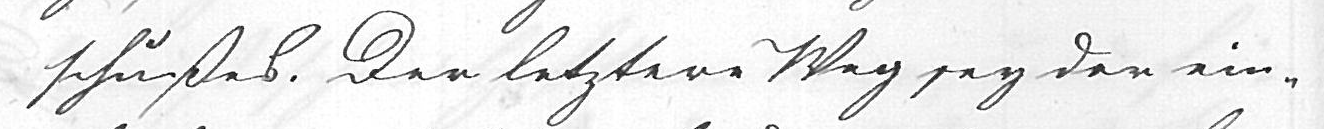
schußes. Der letztere Weg sey der ein-
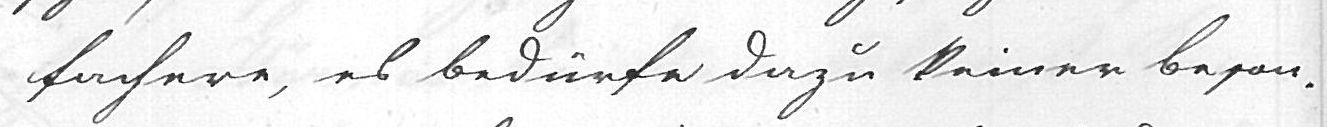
fachere, es bedürfe dazu keiner beson-
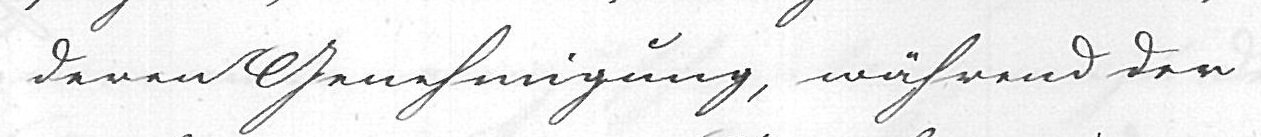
deren Genehmigung, während der
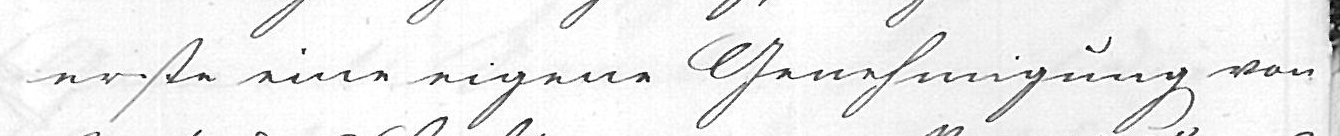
erste eine eigenen Genehmigung von
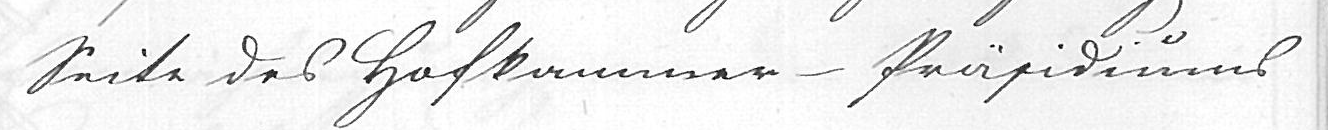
Seite des Hofkammer-Präsidiums
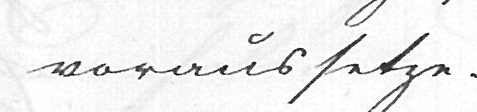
voraussetze.
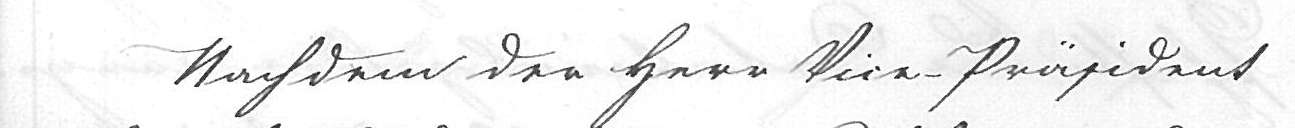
Nachdem der Herr Vice-Präsident
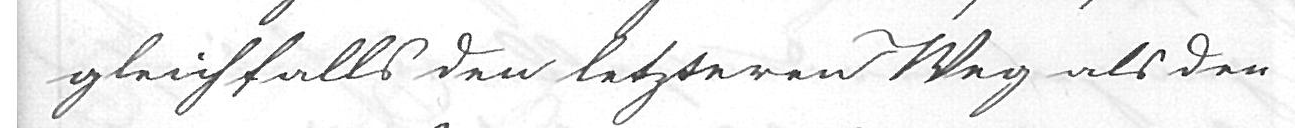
gleichfalls den letzteren Weg als den
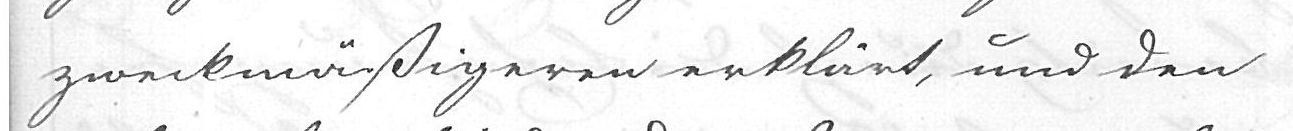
zweckmäßigeren erklärt, und den
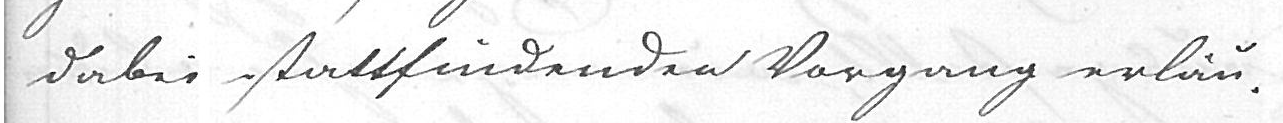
dabei stattfindenden Vorgang erläu-
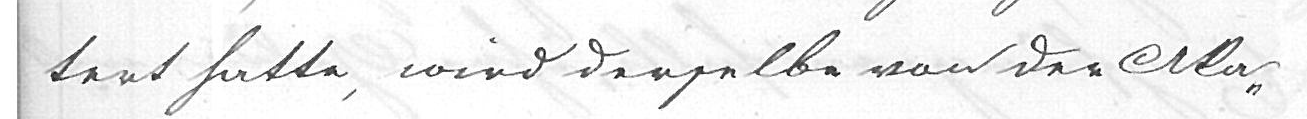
tert hatte, wird derselbe von der Aka-
